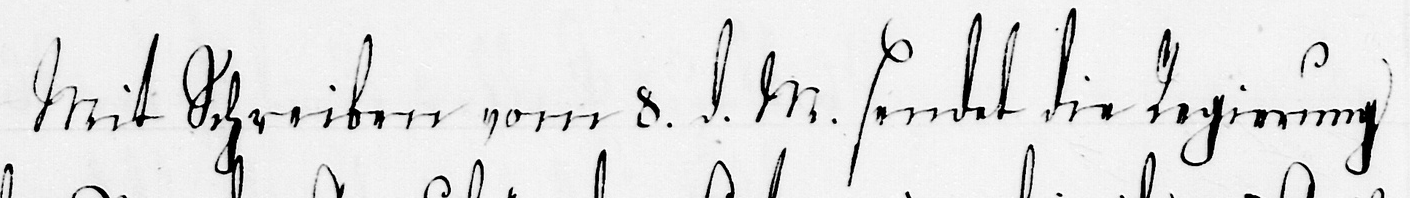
Mit Schreiben vom 8. d. M. sendet die Regierung
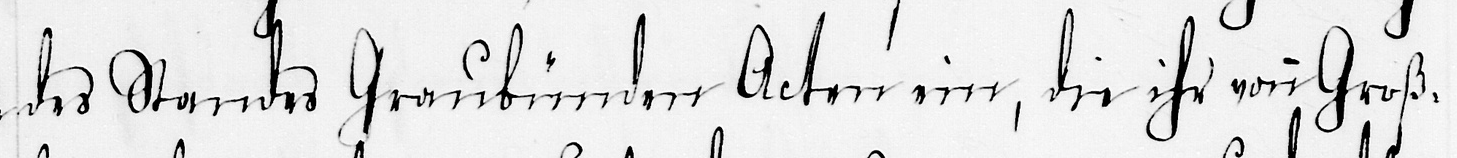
des Standes Graubünden Acten ein, die ihr von Groß¬
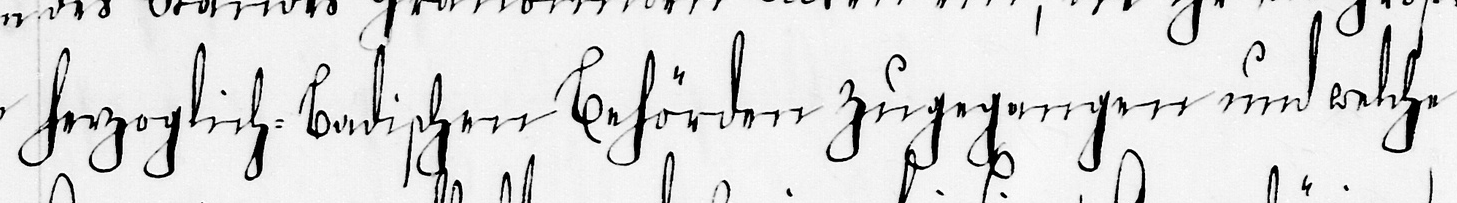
herzoglich-Badischen Behörden zugegangen und welche
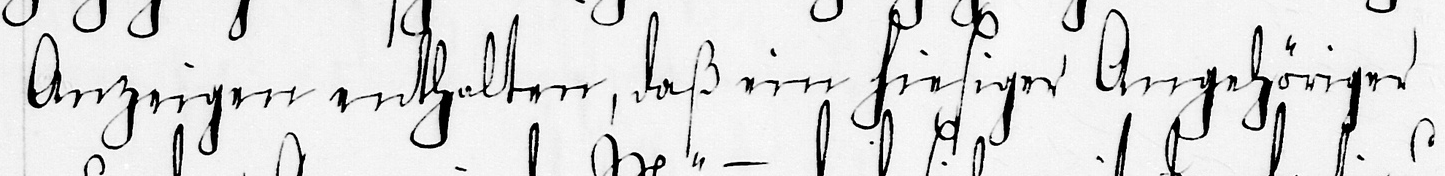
Anzeigen enthalten, daß ein hiesiger Angehöriger
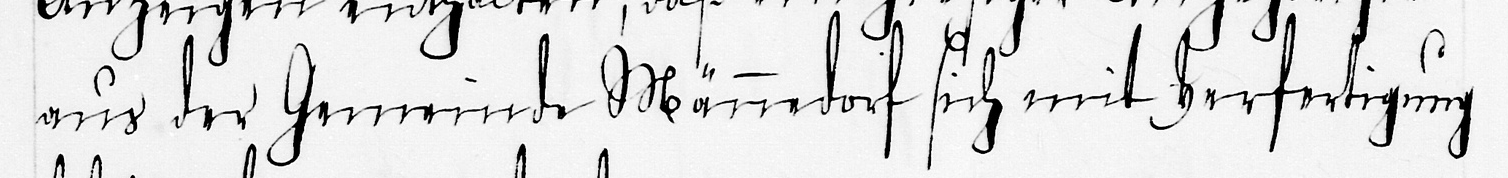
aus der Gemeinde Männedorf sich mit Verfertigung
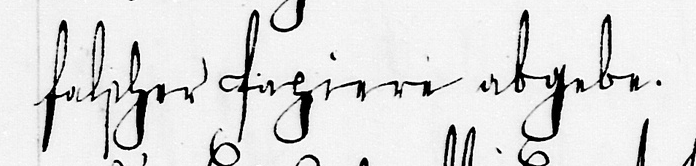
solcher Papiere abgebe.
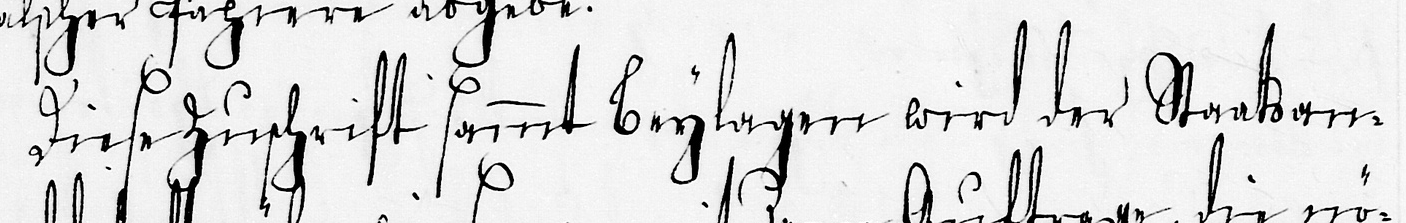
Diese Zuschrift sammt Beylagen wird der Staatsan¬
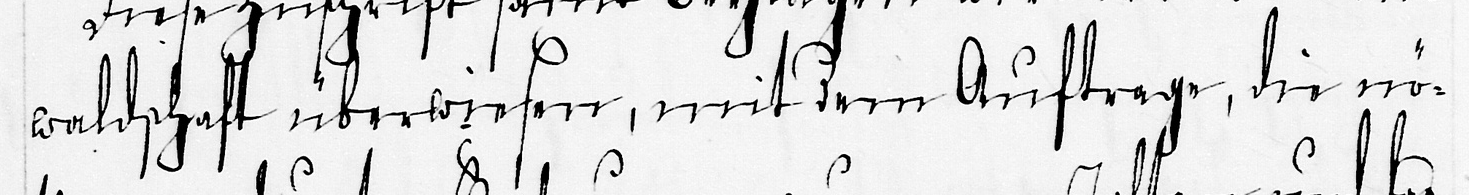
waldschaft überwiesen, mit dem Auftrage, die nö¬
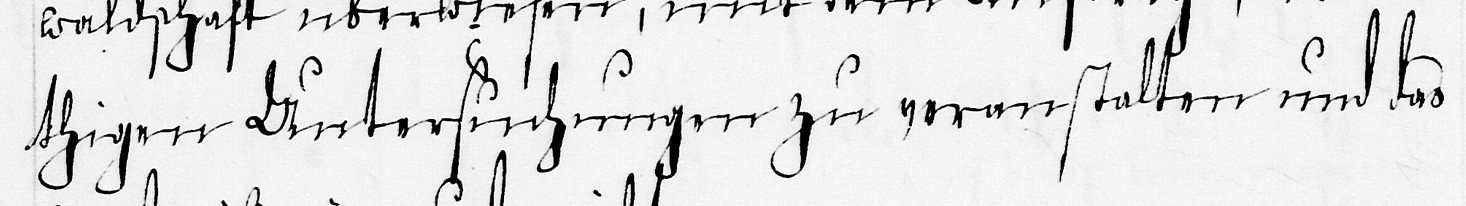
thigen Untersuchungen zu veranstalten und das
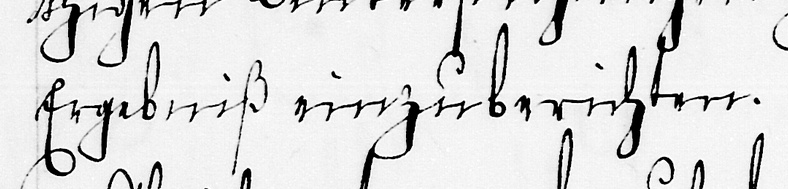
Ergebniß einzuberichten.
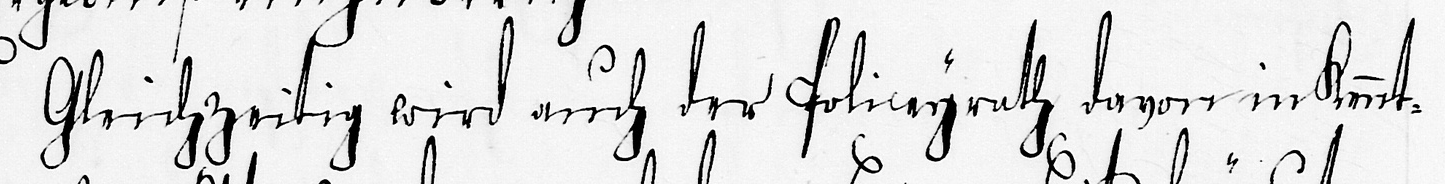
Gleichzeitig wird auch der Policeyrath davon in Kenn¬
